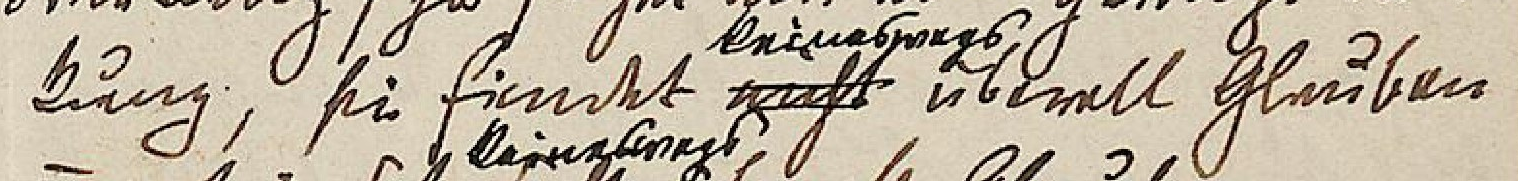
kung, sie findet nicht überall Glauben
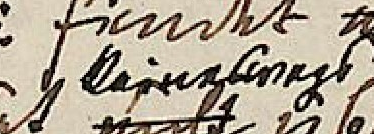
keineswegs
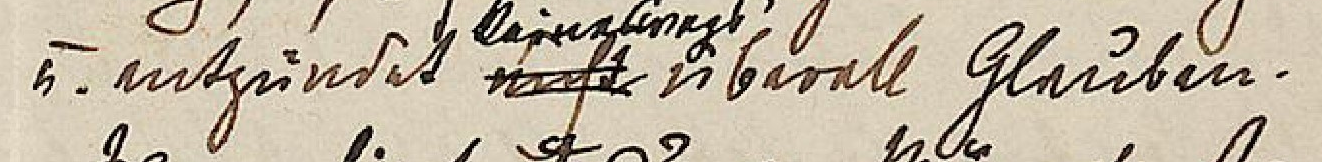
u. entzündet nicht überall Glauben.
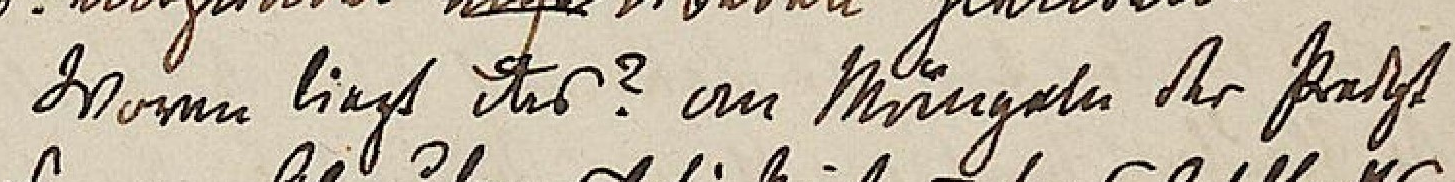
Woran liegt das? an Mängeln der Predigt
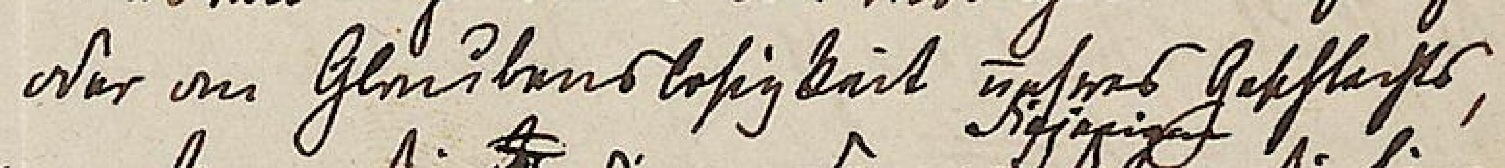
oder an Glaubenslosigkeit unseres Geschlechts,
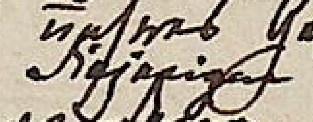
diegenigen
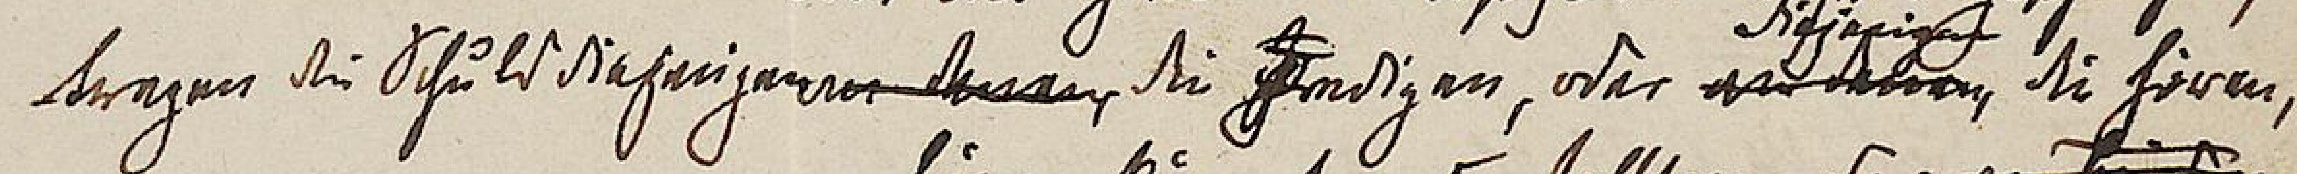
tragen die Schuld diejenigen derer, die Predigen, oder von denen, die hören,
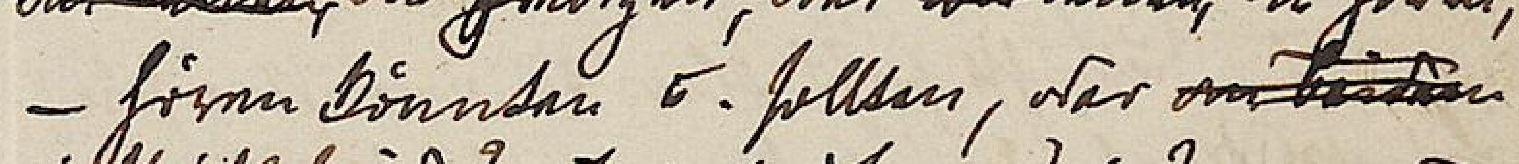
_ hören könnten u. sollten, oder an beiden
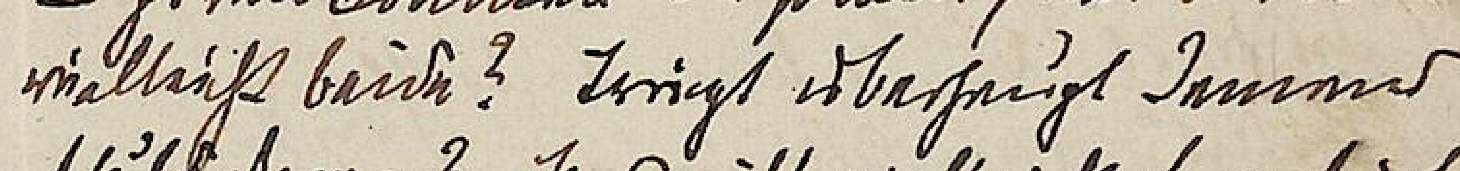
vielleicht beide? Trägt überhaupt Jemand
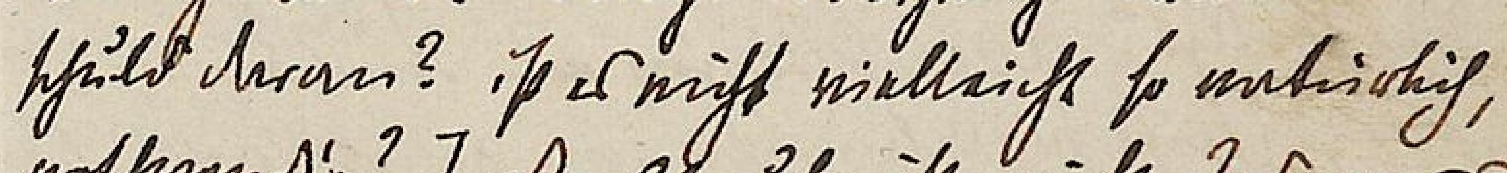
schuld daran? ist es nicht vielleicht so natürlich,
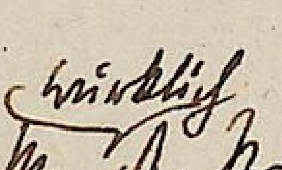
wirklich
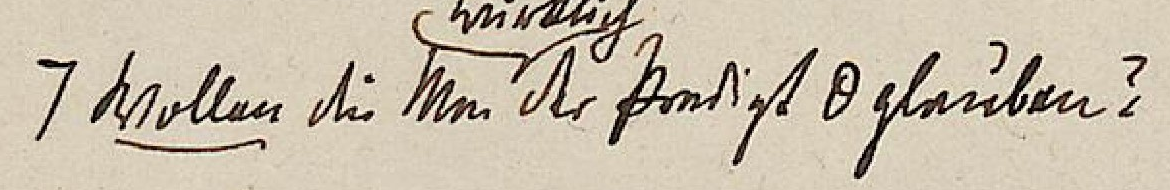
] Wollen die Mn der Predigt o glauben?
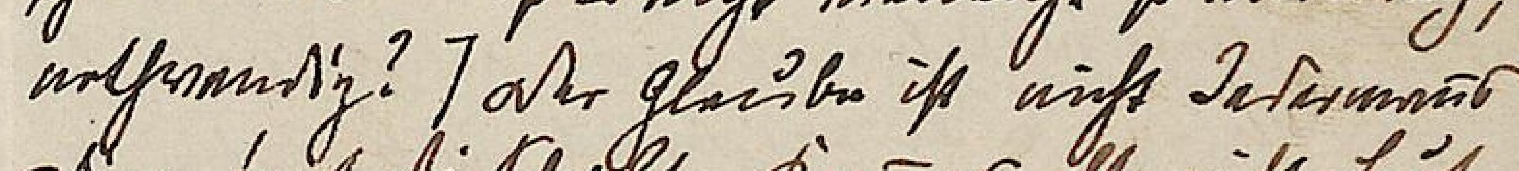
nothwendig? ] Der Glaube ist nicht Jedermanns
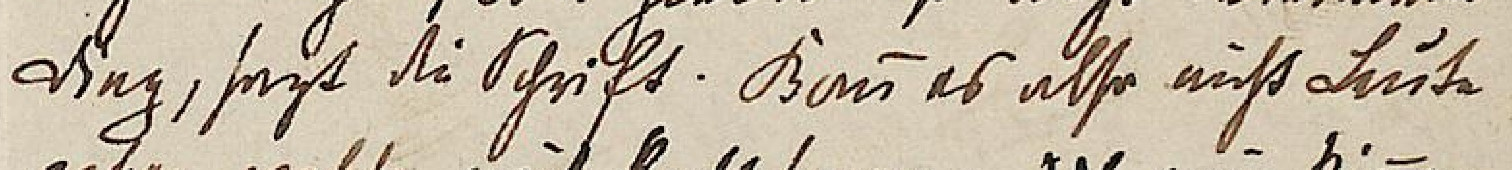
Ding, sagt die Schrift. Kan es also nicht Leute
